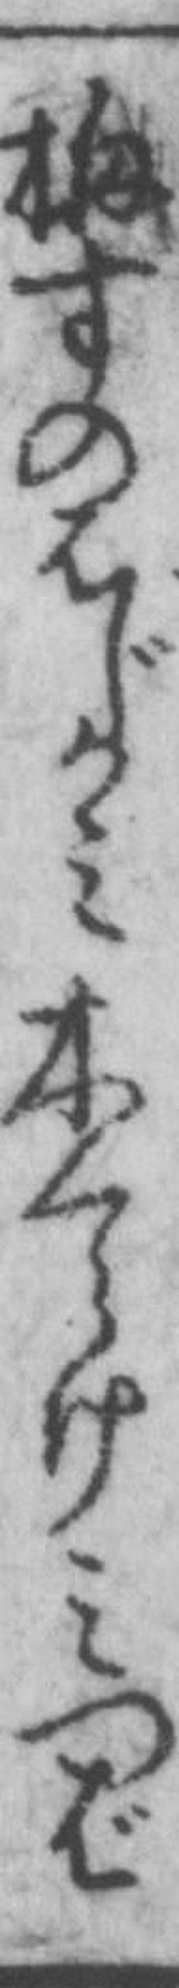梅すのはじかミ木くらげミつば
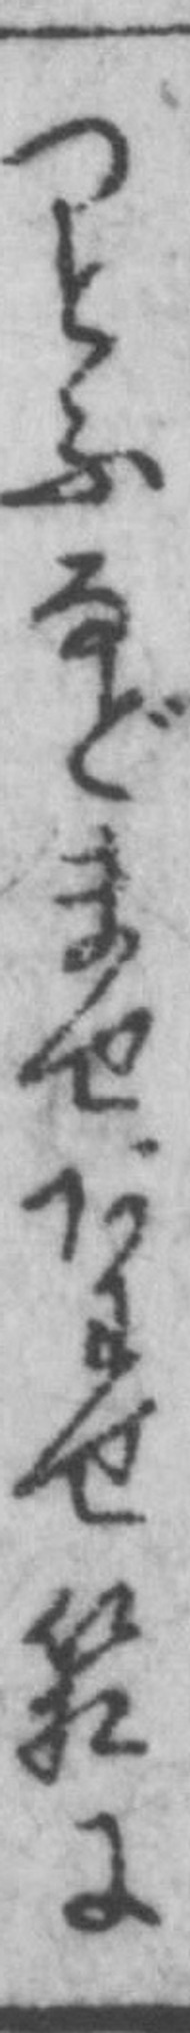つとふなどませ何にせ箱に
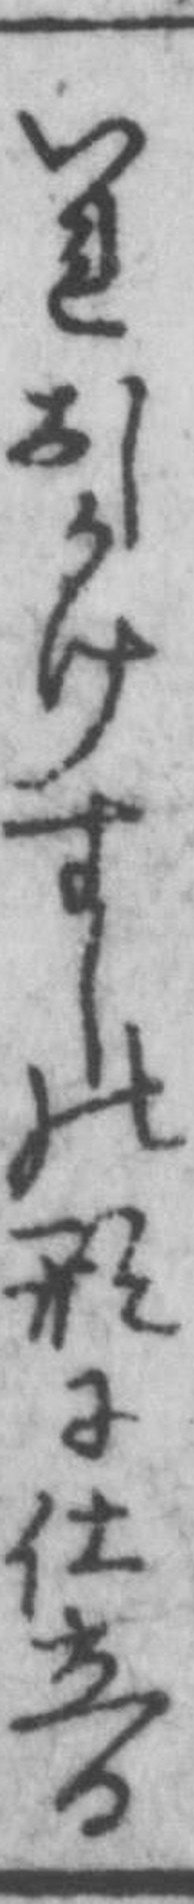いれおしかけすしの形に仕立る
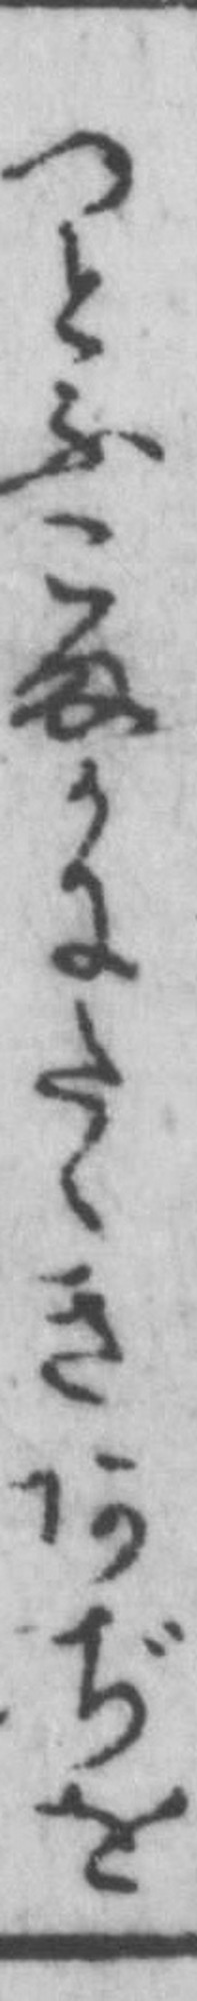つとふこまかにたゝきあぢを
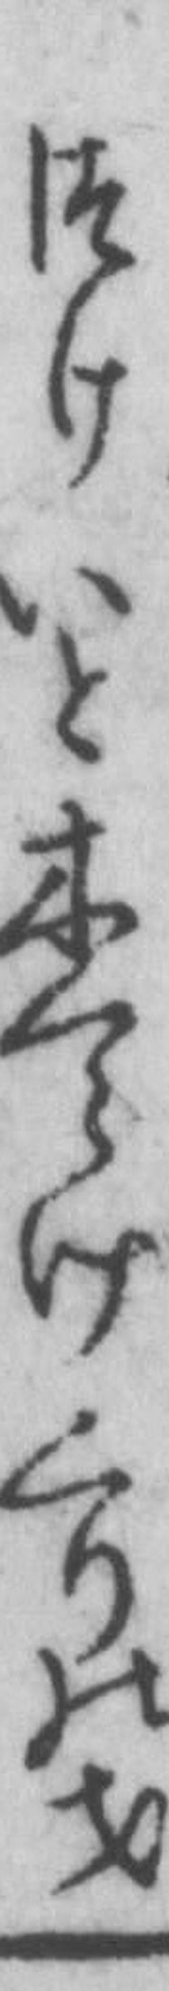つけいと木くらげくりの身
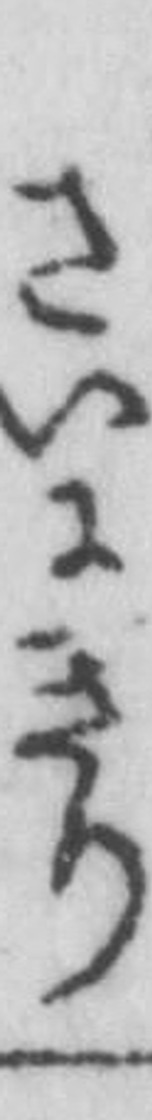さいにきり
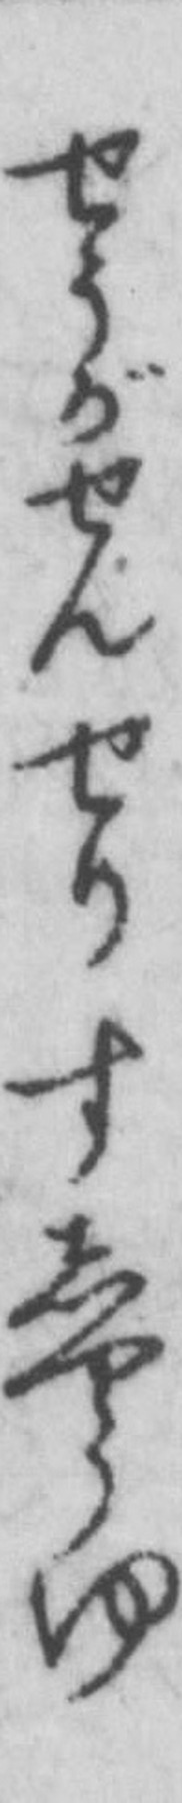せうがせんせりすしやうゆ
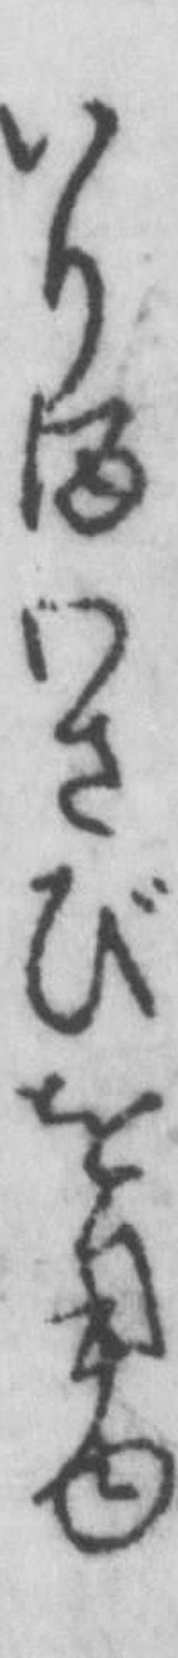いり酒ワさびを用ゆ
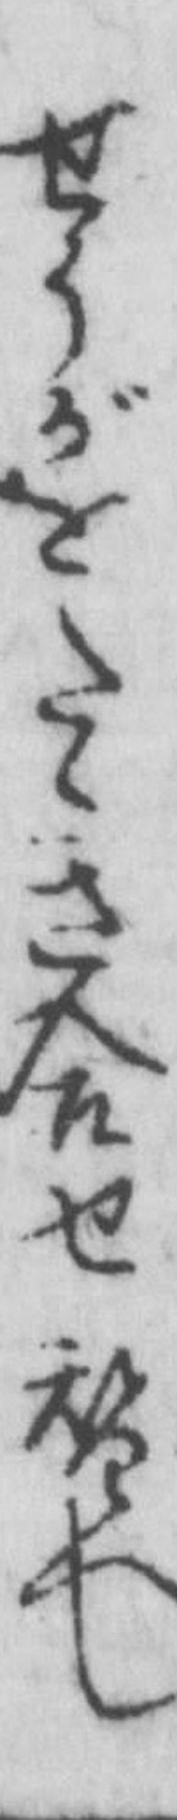せうがをたゝき合せ替ゆへし
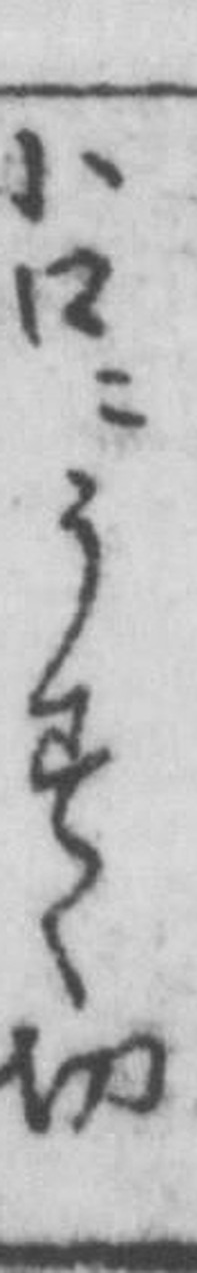小口にうすく切
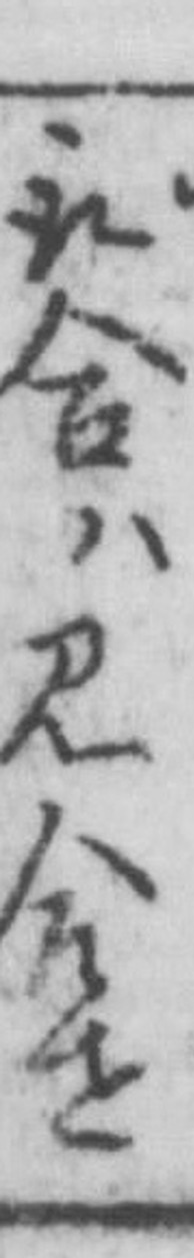取合ハ見合す
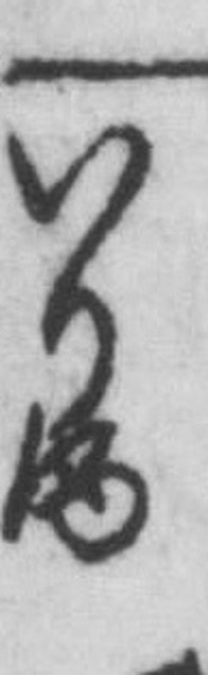いり酒

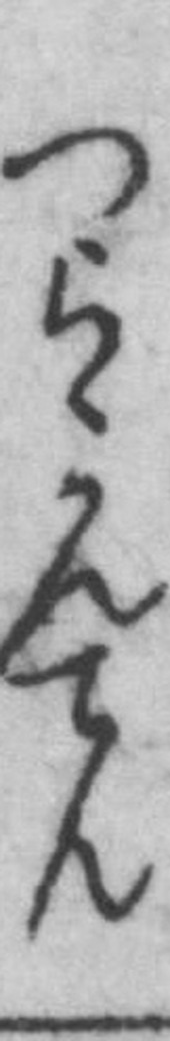つらゝかんてん
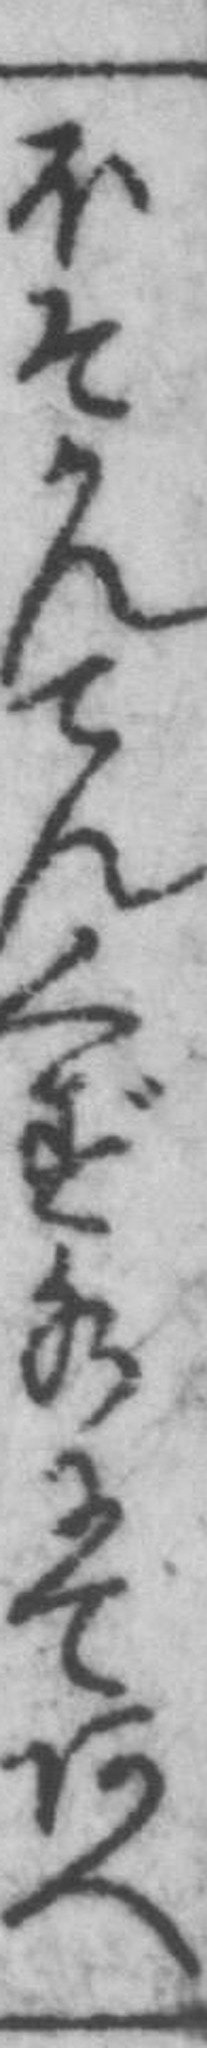ほそかんてんくず水にてあへ
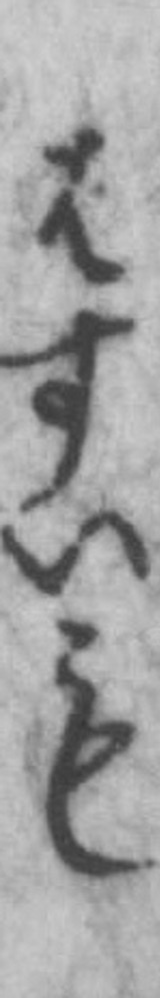はすいも
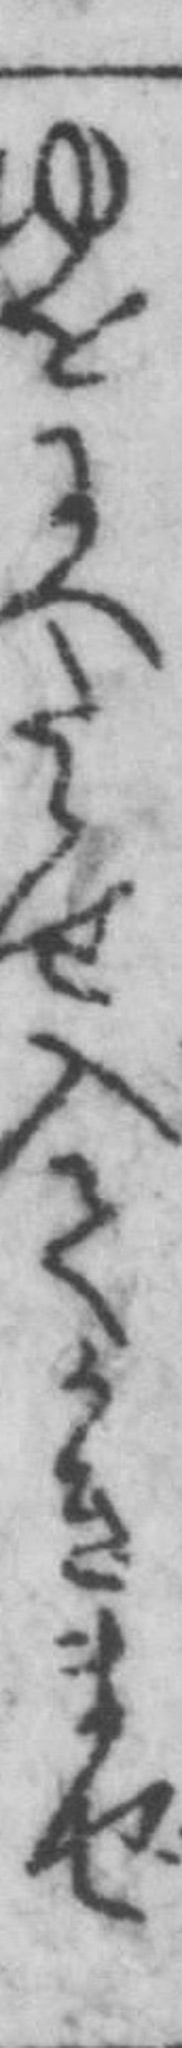ゆをにへたゝせ入てかきまぜ
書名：料理献立抄
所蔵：大阪府立大学学術情報センター 国文学研究資料館
